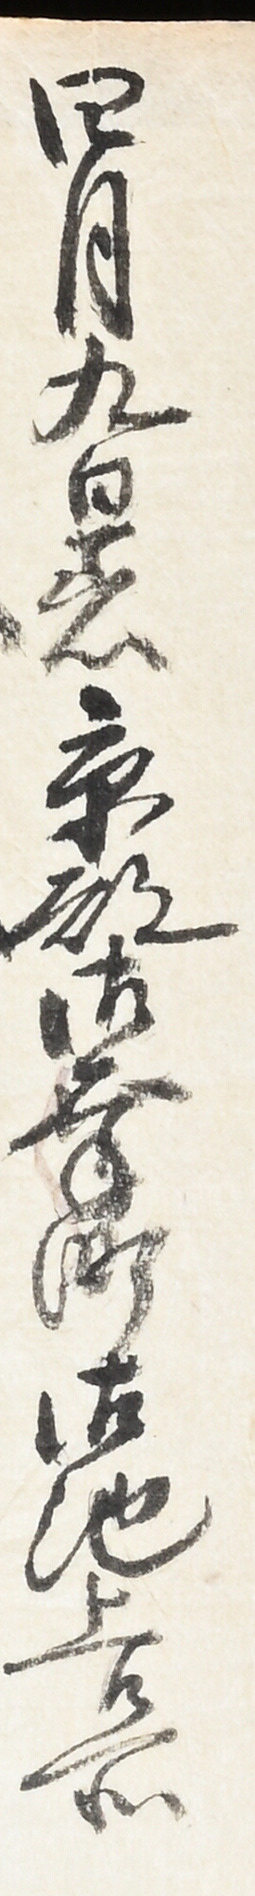四月九日着京都御幸町御池上ル所
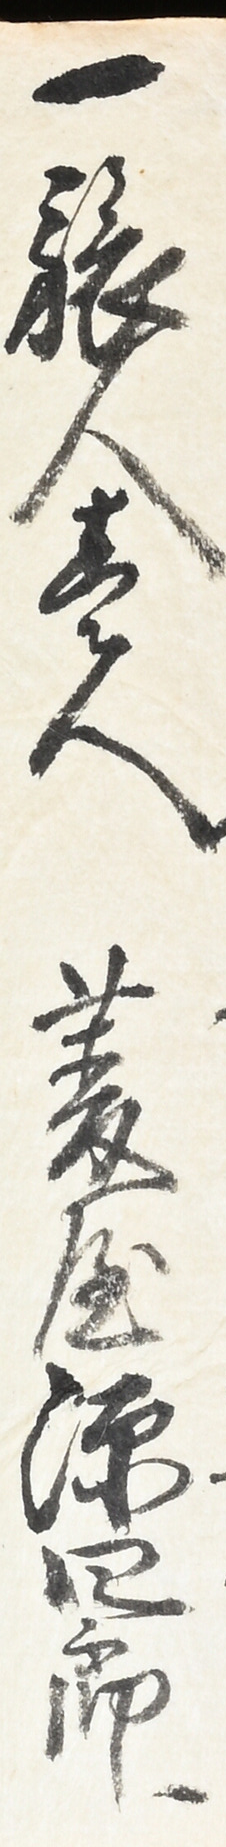一旅人壱人菱屋源四郎・
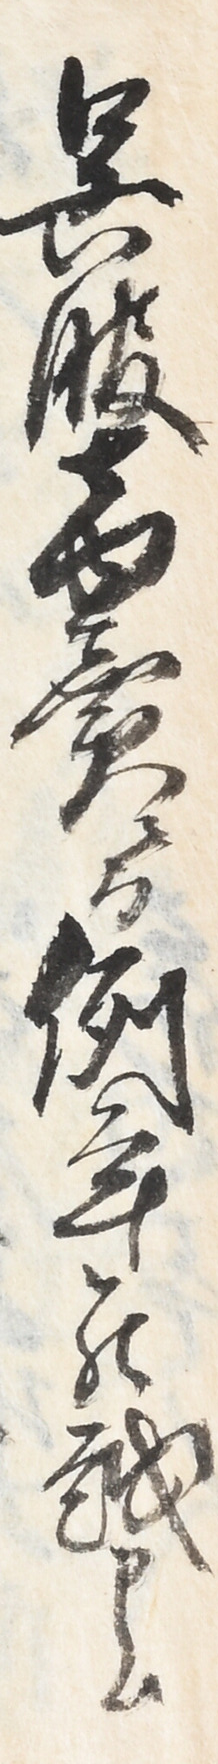小間物商売ニ而例年罷越申候
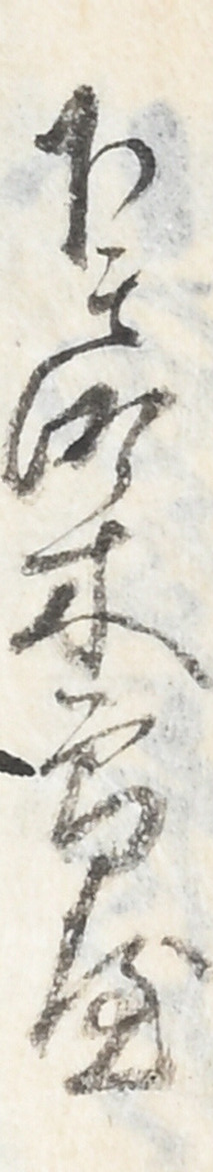下モ町木曽屋
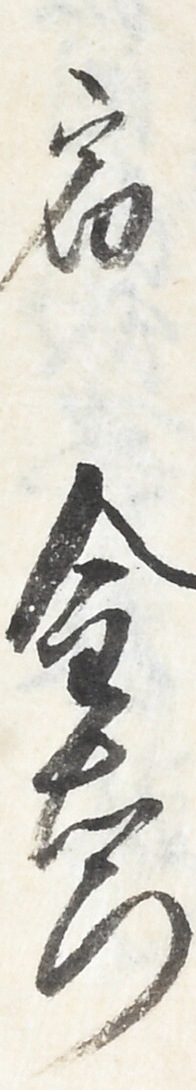宿金右衛門
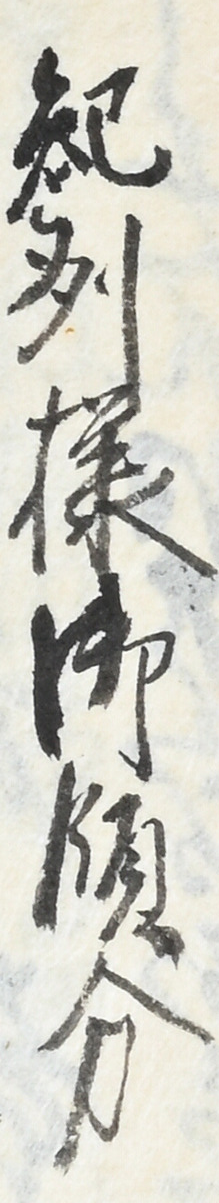尾張様御領分

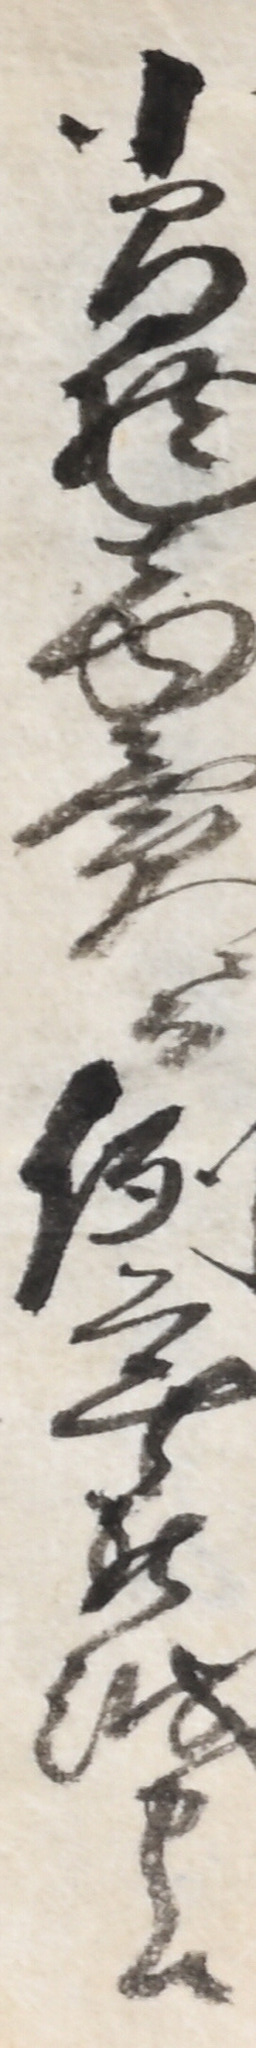小間物商売ニ而例年罷越申候
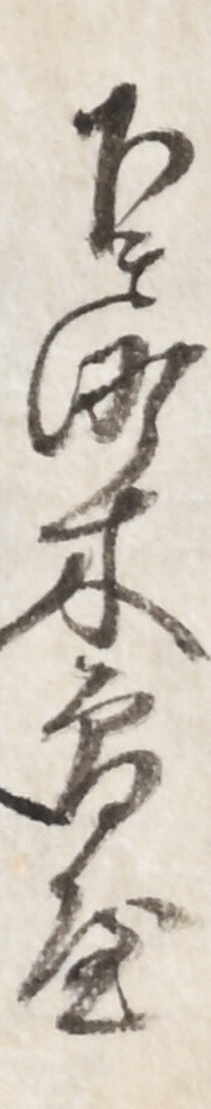下モ町木曽屋
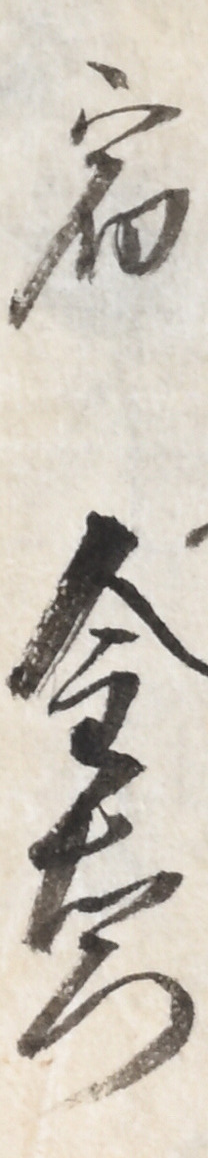宿金右衛門
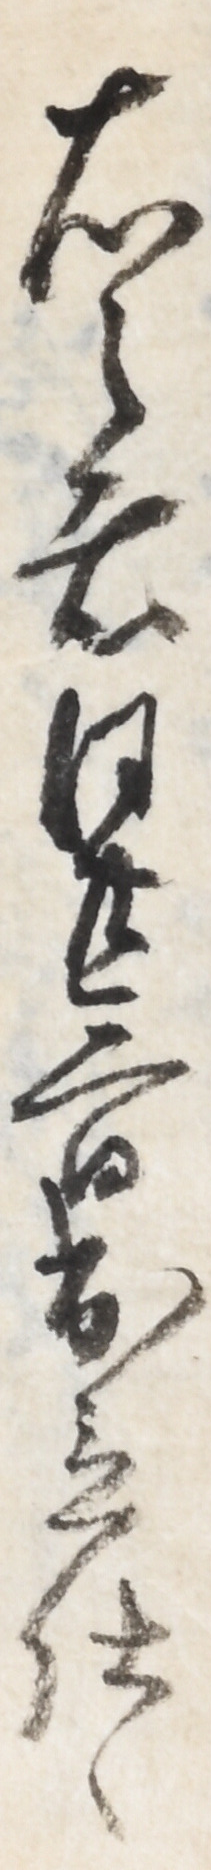右之者同廿六日出立仕候
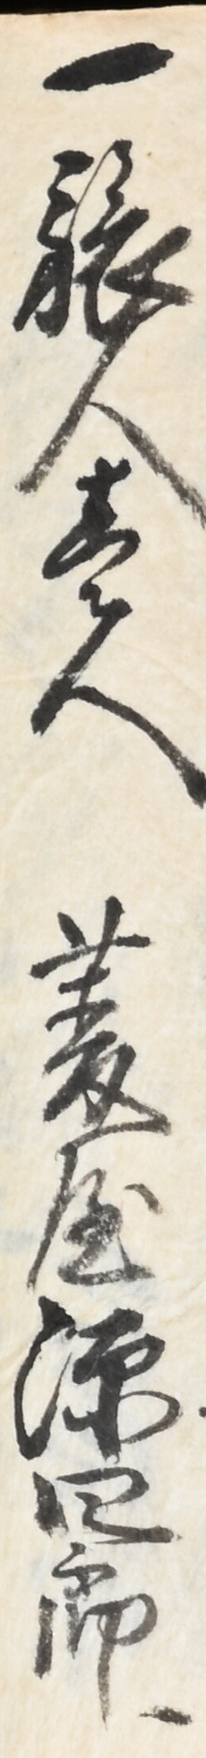一旅人壱人形屋又市
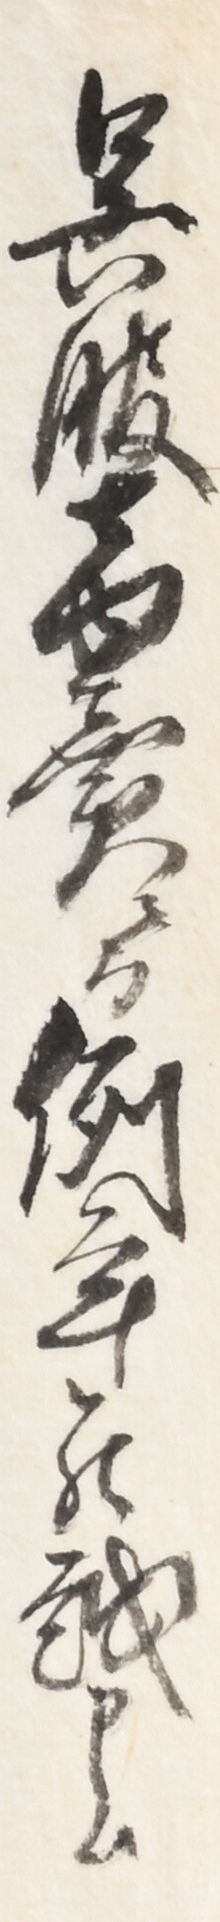呉服商売ニ而例年罷越申候
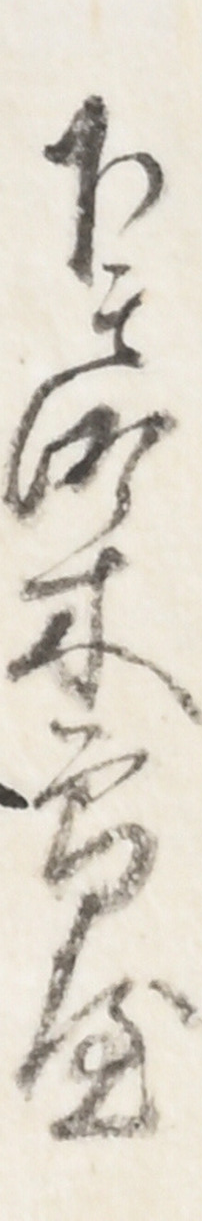下モ町木曽屋
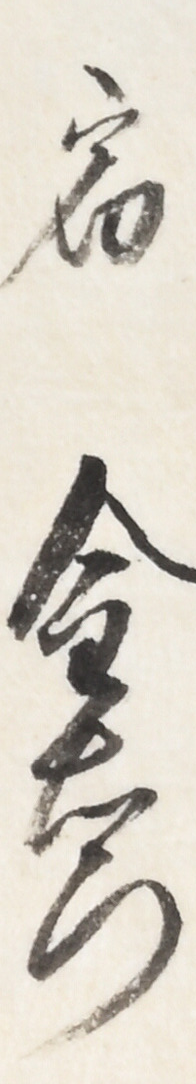宿金右衛門
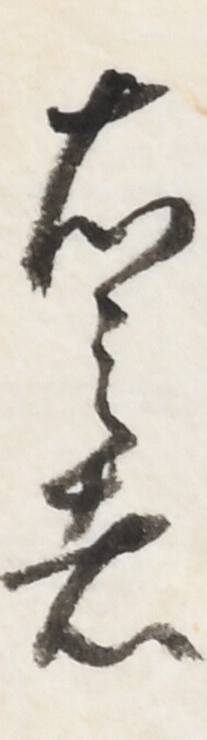右之者
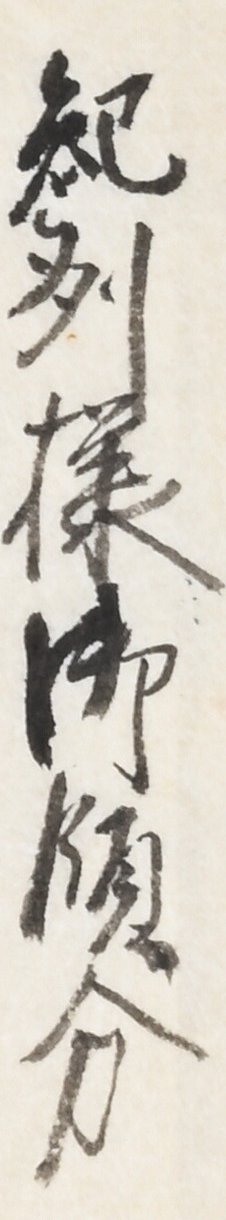紀州様御領分
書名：旅人泊控帳
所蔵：伊那市立高遠町図書館・合同会社AMANE
